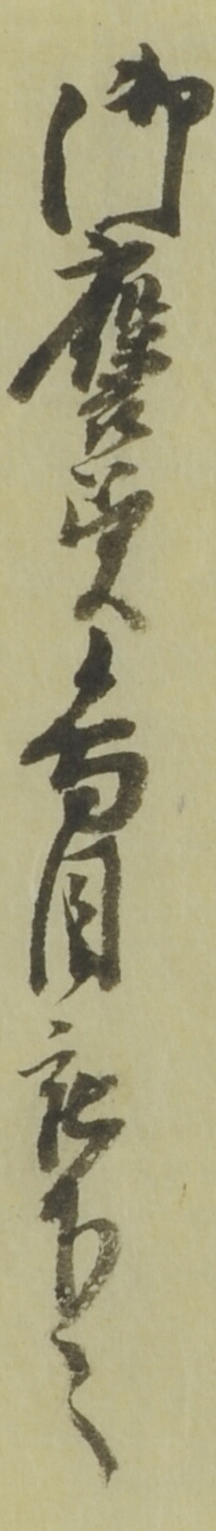御褒美鳥目被下之
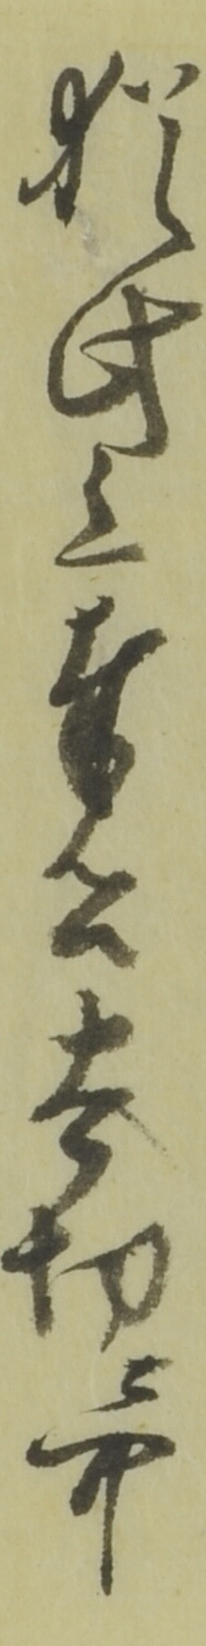猶此上奉公太切ニ可
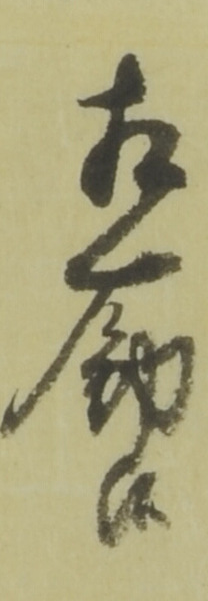相励候
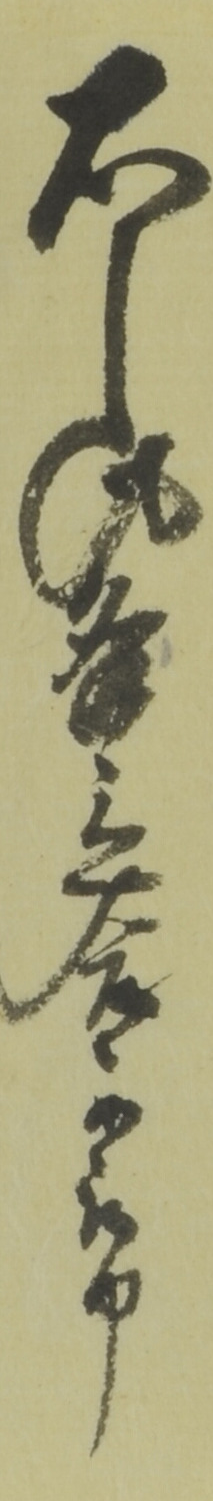右之趣各立合可被申
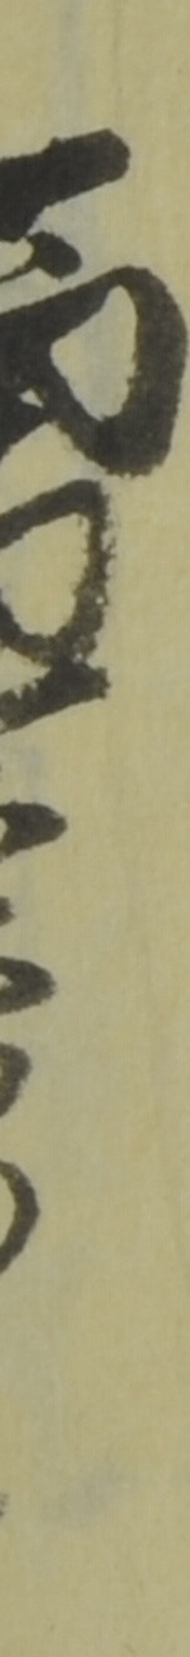高田六右衛門殿

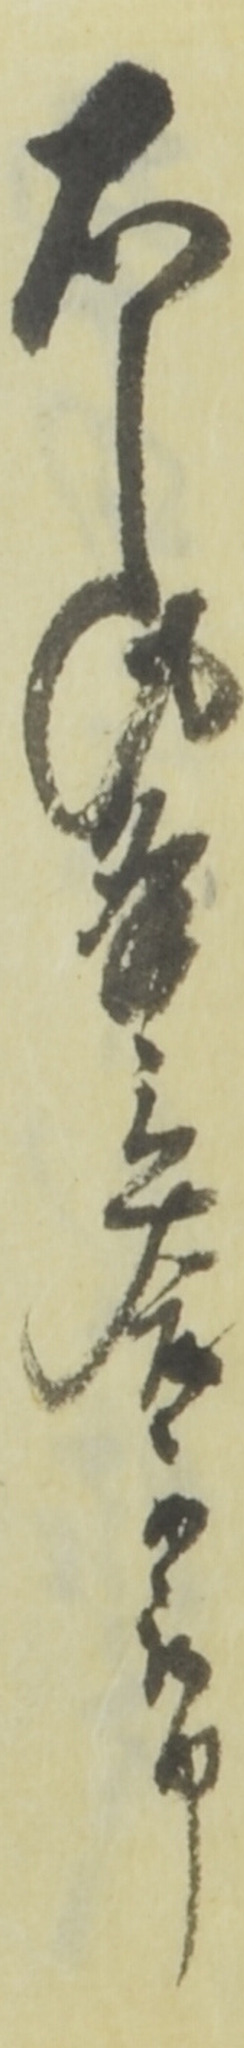右之趣有之者候可被申
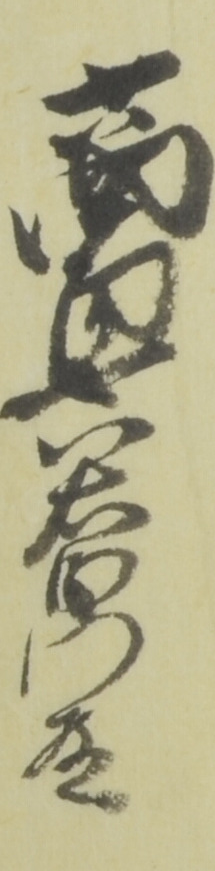高田六右衛門殿
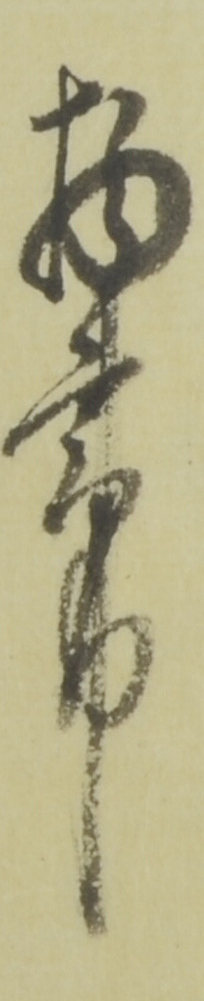物書中
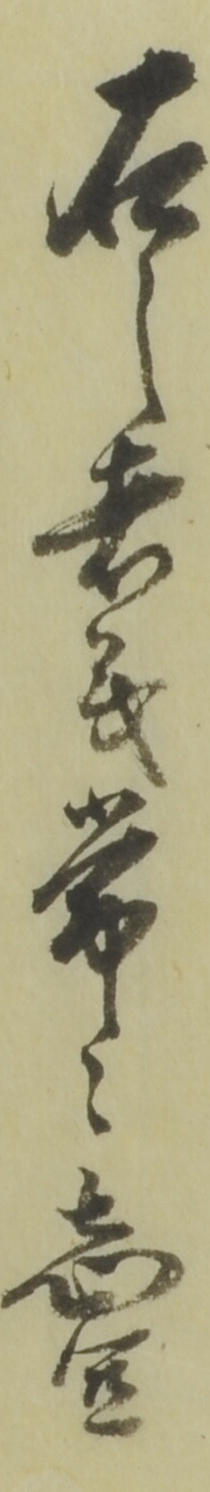右之者義常々志宜
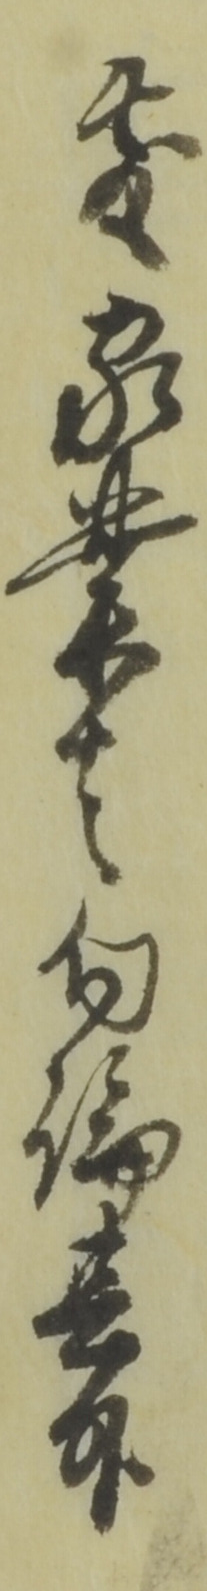敷家業は勿論其外
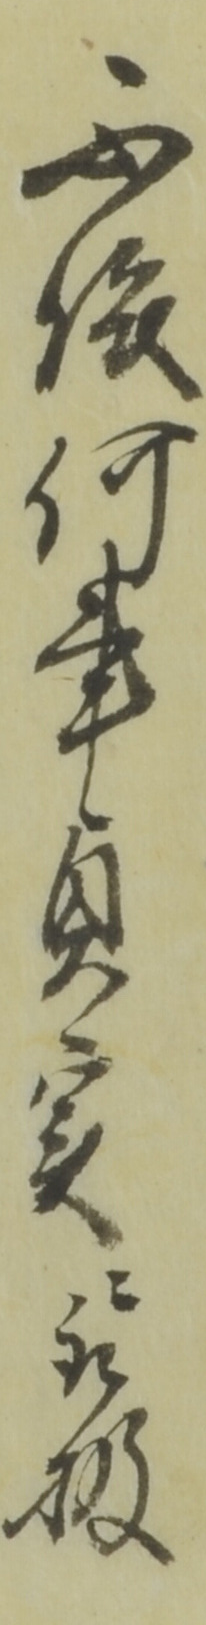不依何事貞実ニ取扱
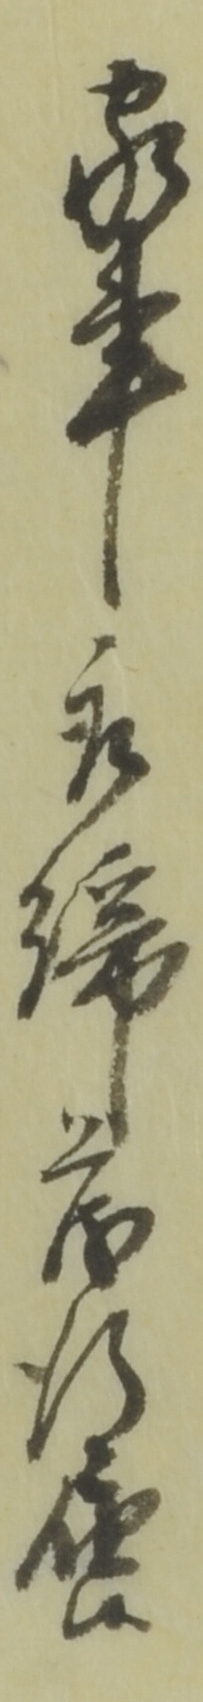家事取締も行届候
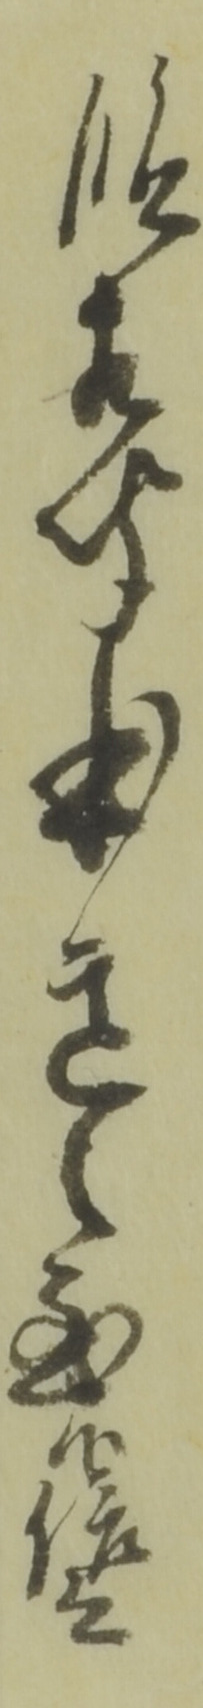段相聞本意之至候依之
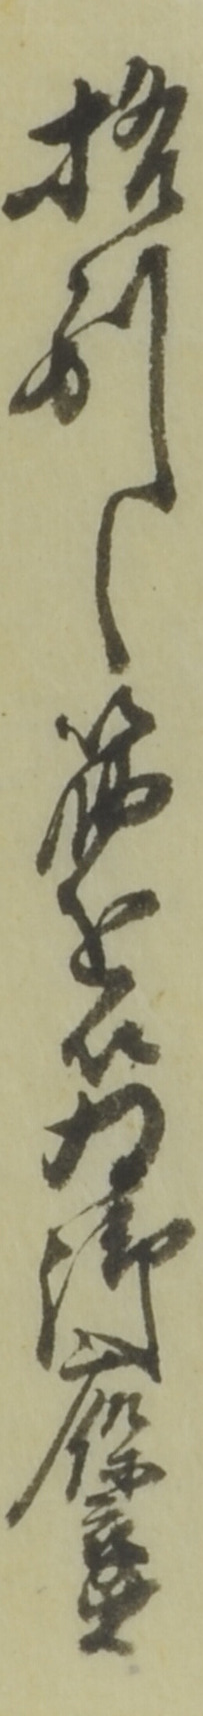格別之筋を以為御褒美
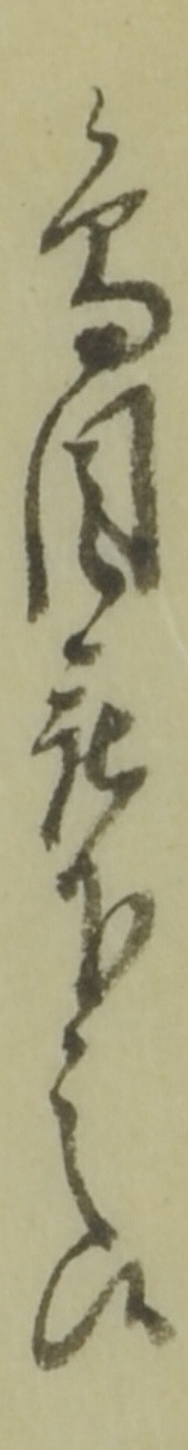鳥目被下之候
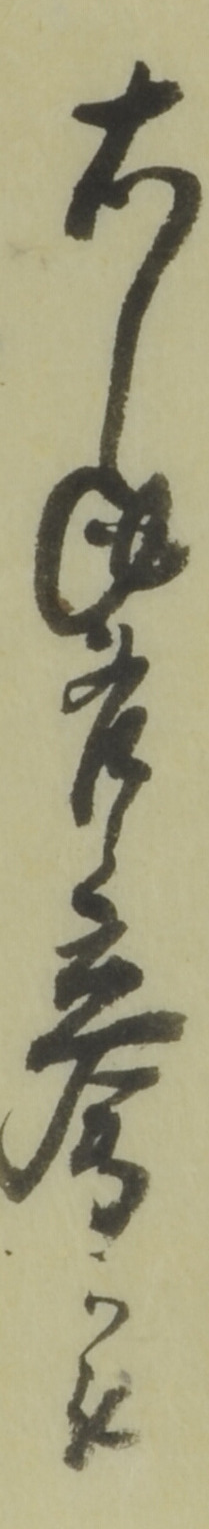右之趣各立会可被
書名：御触書御書附控
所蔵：伊那市立高遠町図書館・合同会社AMANE
